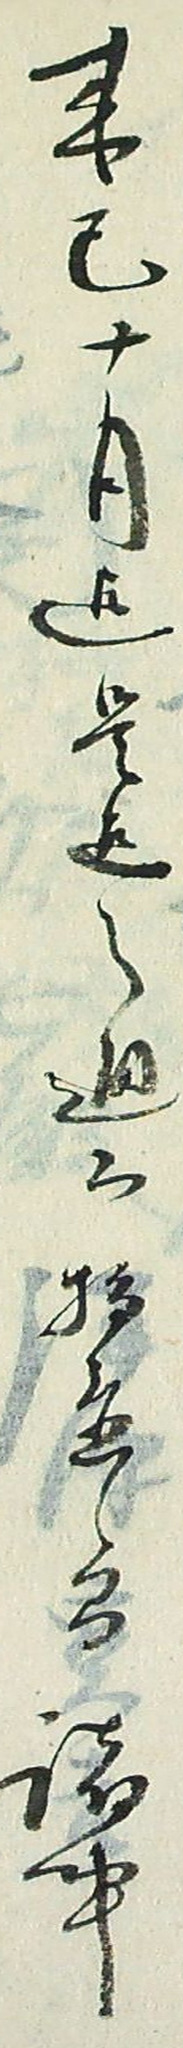来巳十月迄是迄之通被指置候間諸事
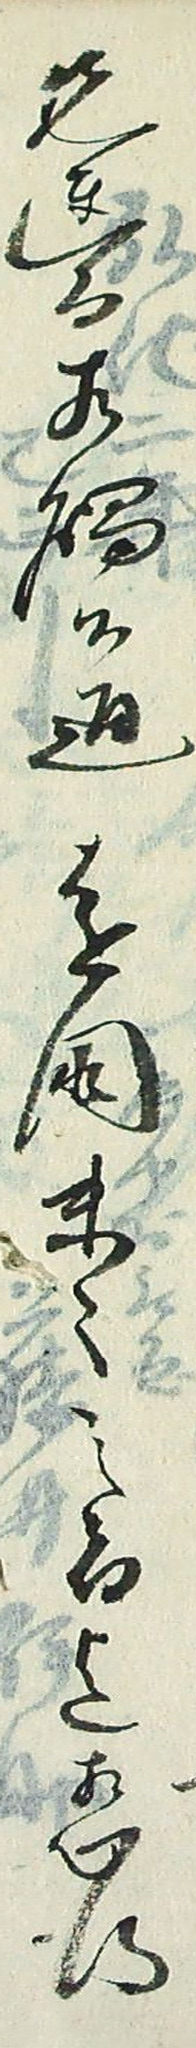先達而相触候通遠国末々之者迄相心得
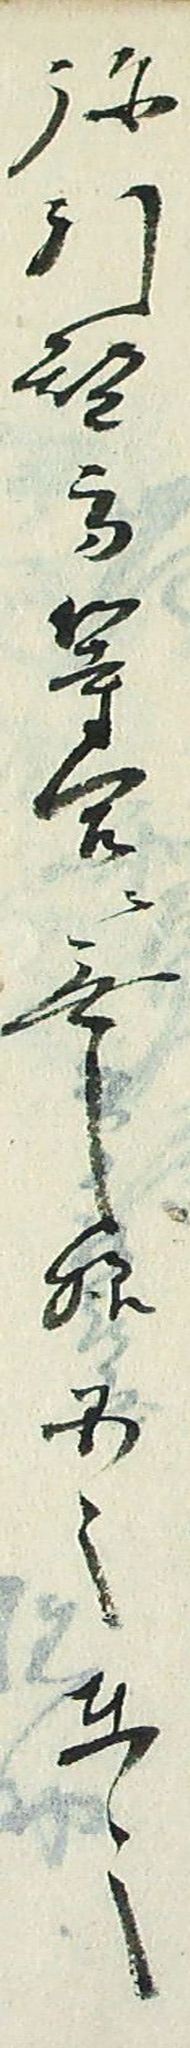弥引替方等閑に無之様国々在々
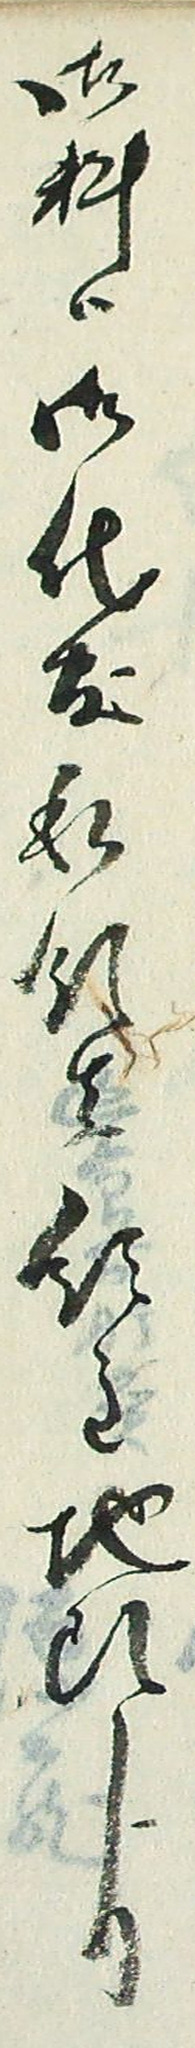御料は御代官私領は領主地頭より
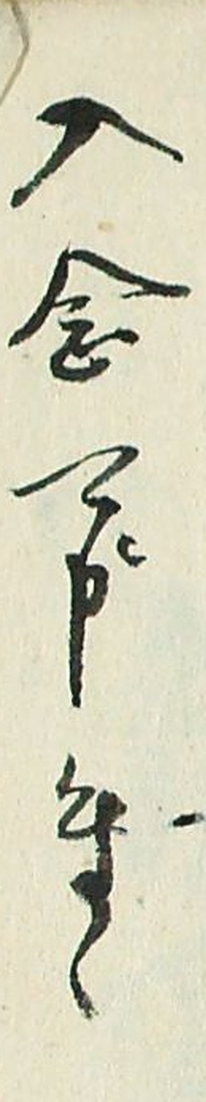入念可被申付候

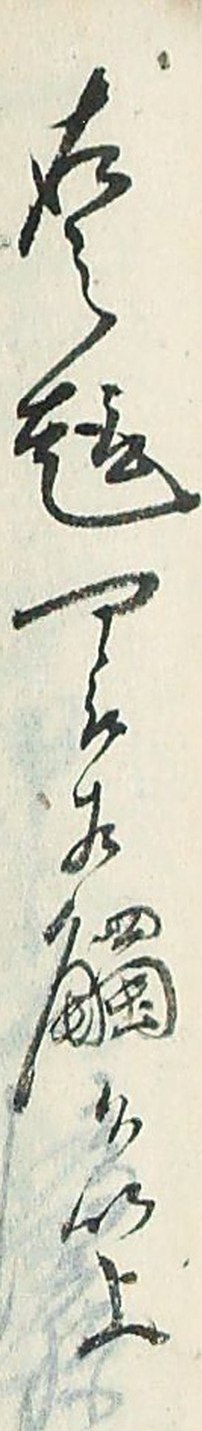右之趣可被相触候以上
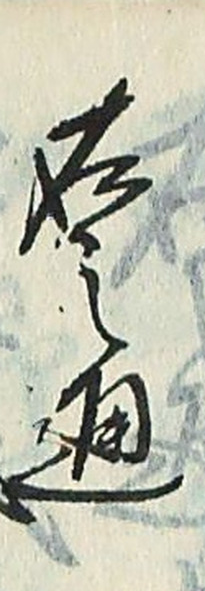右之通
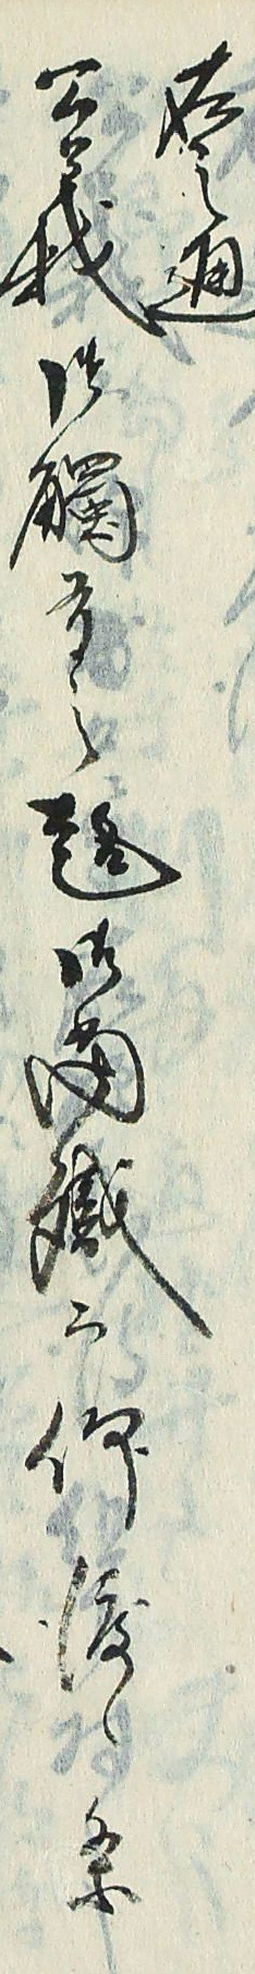公義御触有之趣御当職被仰渡候条
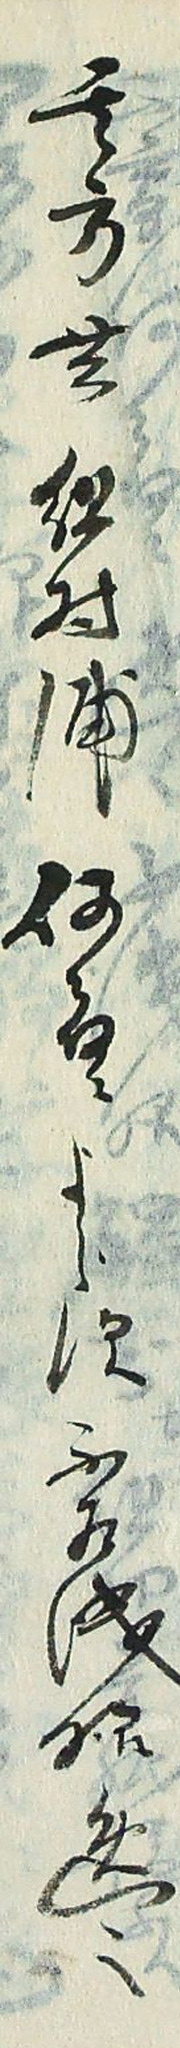其方共組村浦何者によらす不相洩様逸々
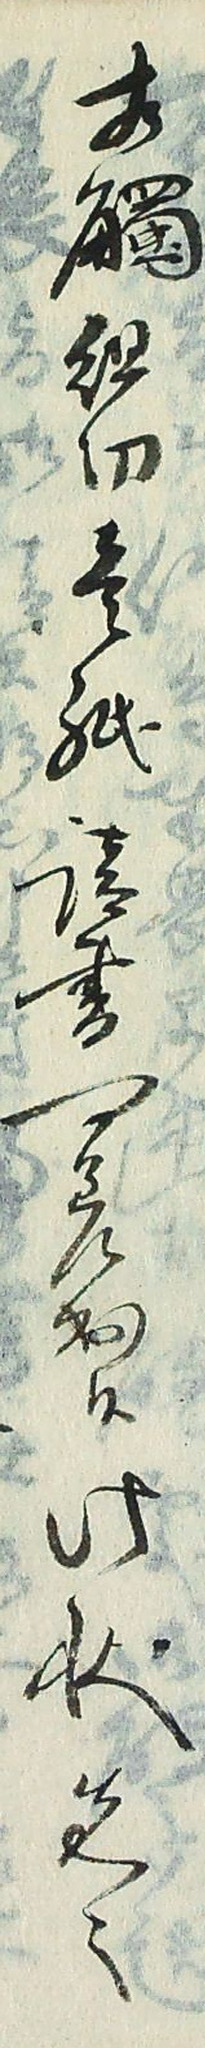相触組切壱紙請書可差出候此状先々
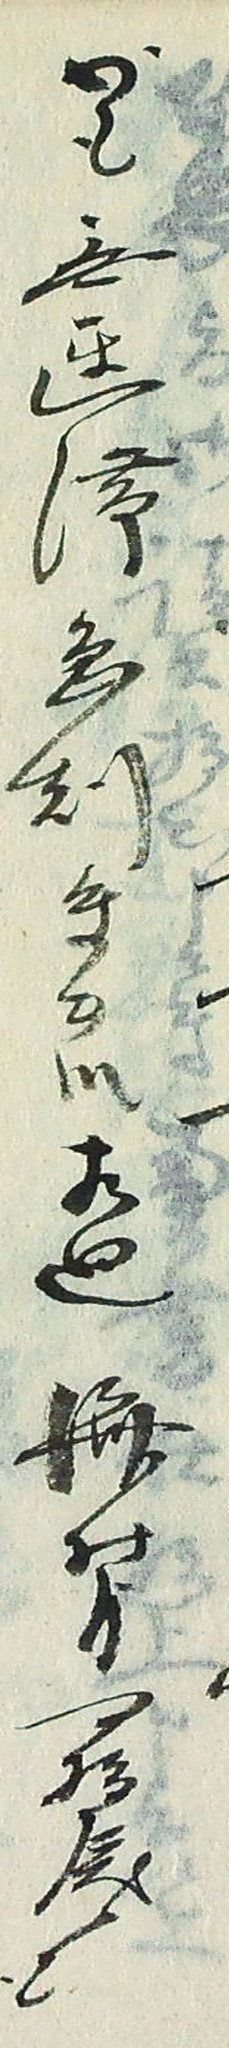少も無遅滞急刻付を以相廻済村ゟ可指戻候以上
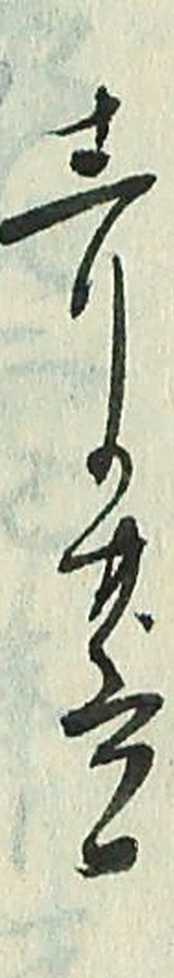十二月廿六日
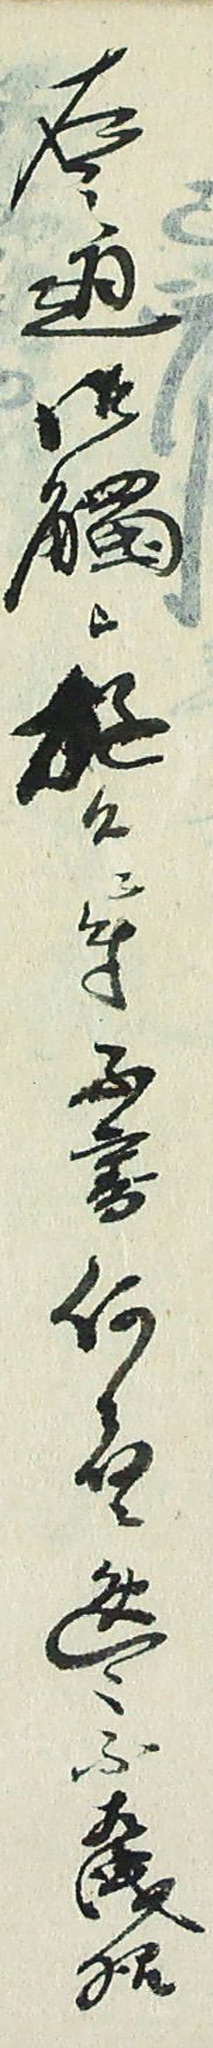右之通御触被遊候に付不寄何者に逸々不相洩様
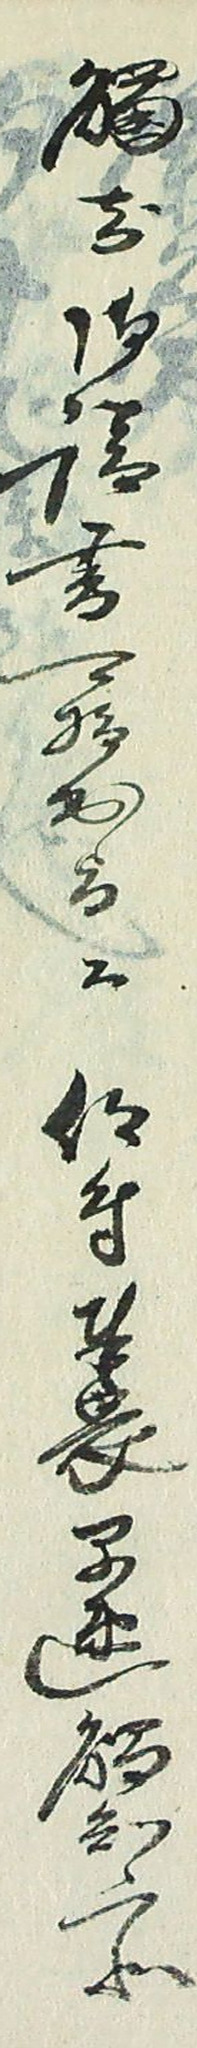触知御請書可指出旨被仰付奉畏早速触知候所
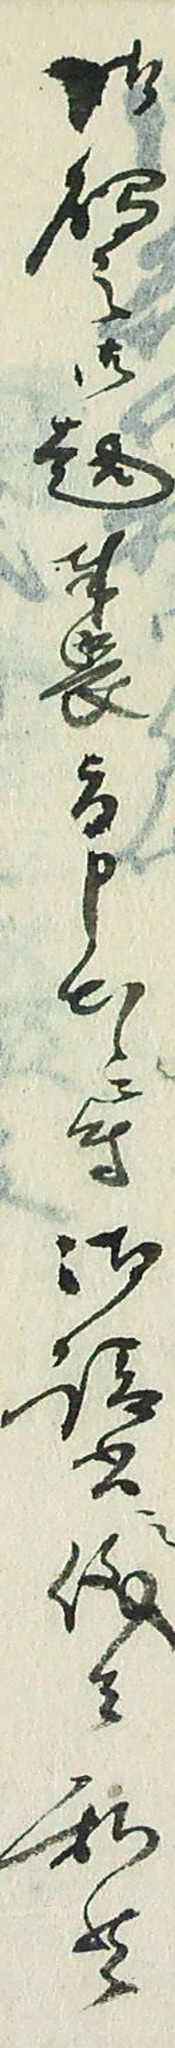御触之御趣奉畏旨申出候に付御請書之儀は私共
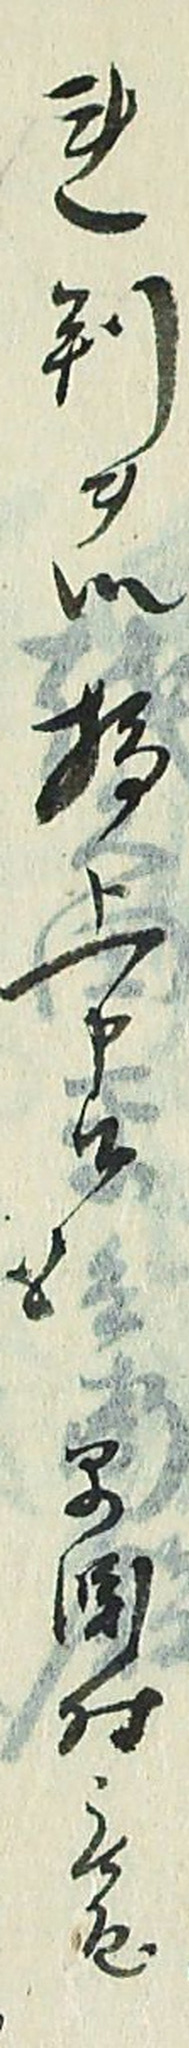連判を以指上申候以上早渕村庄屋
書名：諸御用御□受書控
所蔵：鳴門教育大学 Naruto University of Education
